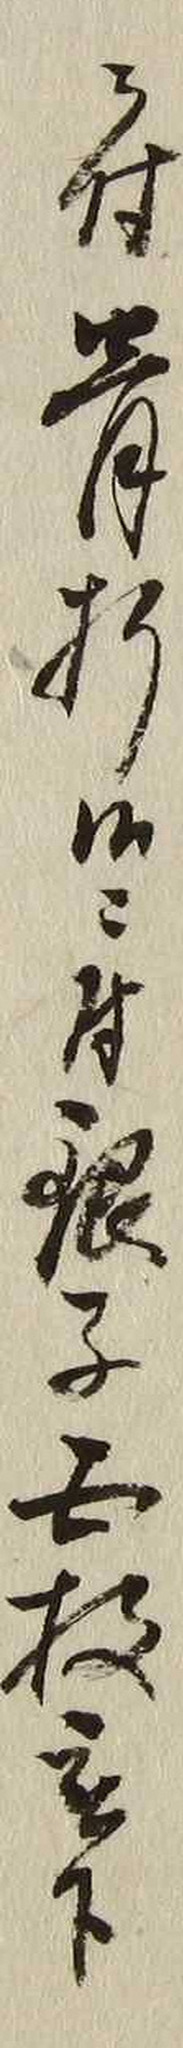ニ付骨折候ニ付銀子五枚被下
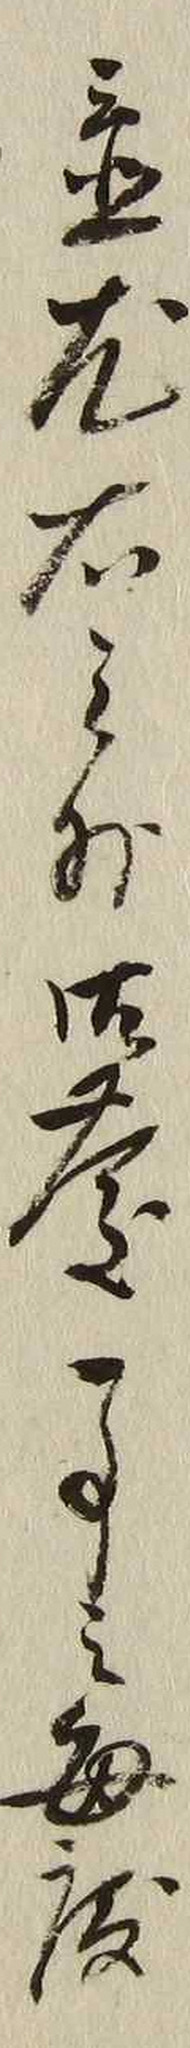置尤右之外御慶事之毎度
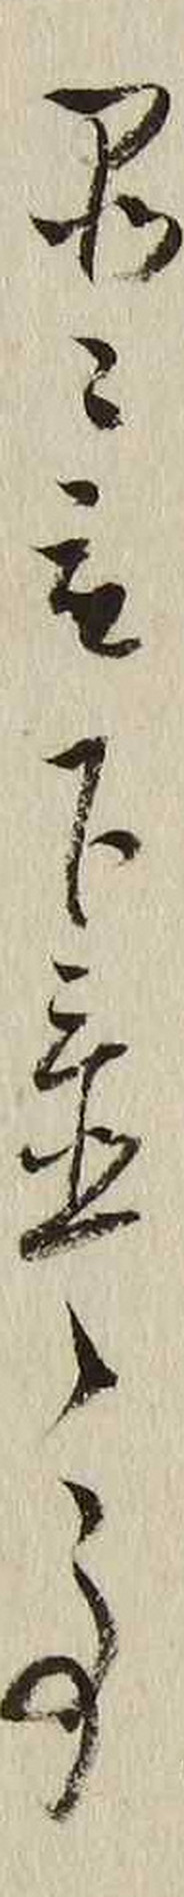品々被下置候事
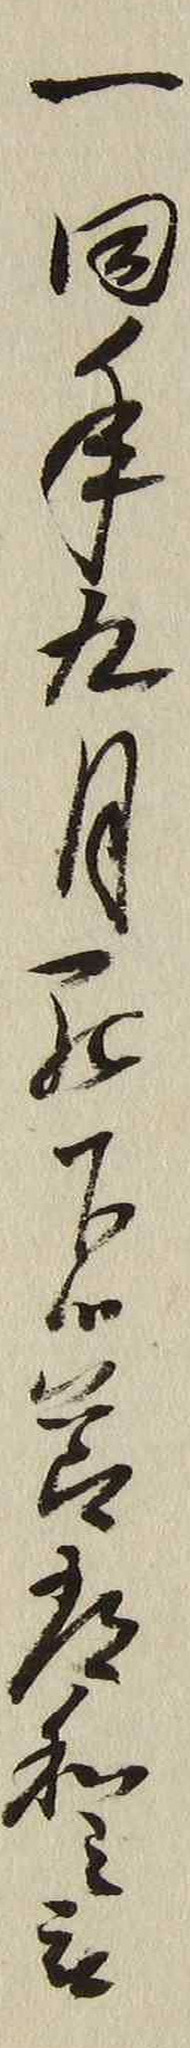一同年九月罷下候節常和之被
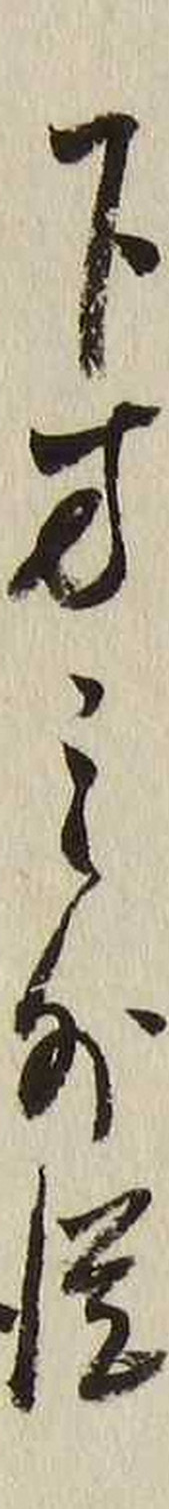下方之外従
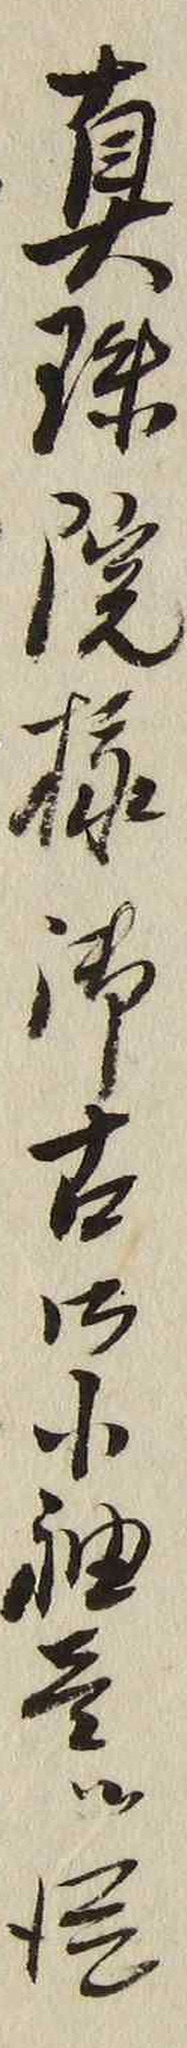真珠院様御古御小袖壱ツ従
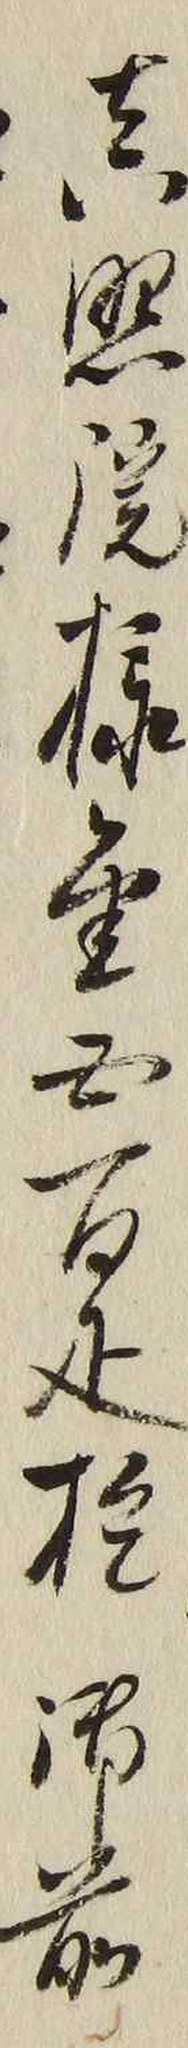真照院様金五百疋於御前

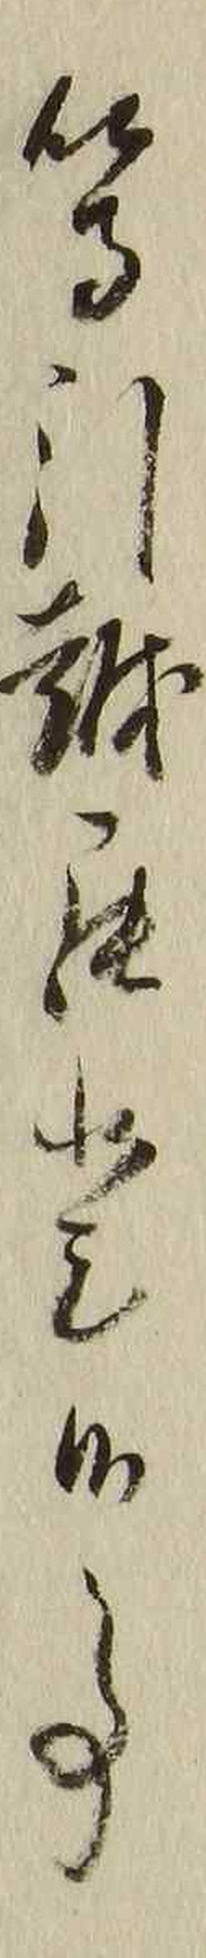等引越罷登候事
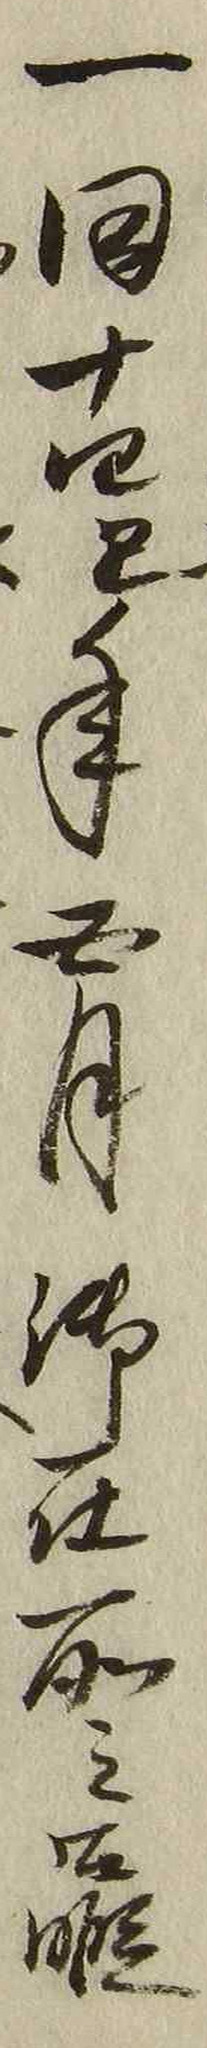一同十四巳年五月御在所之御暇
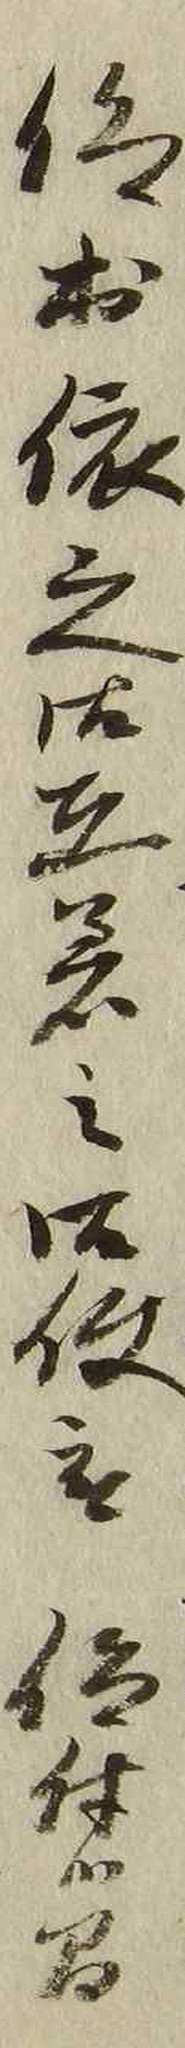仰出依之御在着之御使被仰付候間
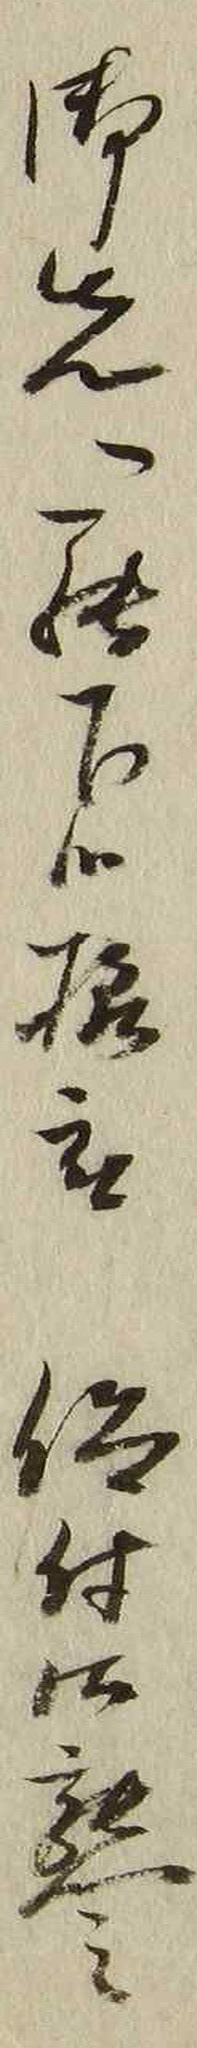御先へ罷下候様被仰付御懇之
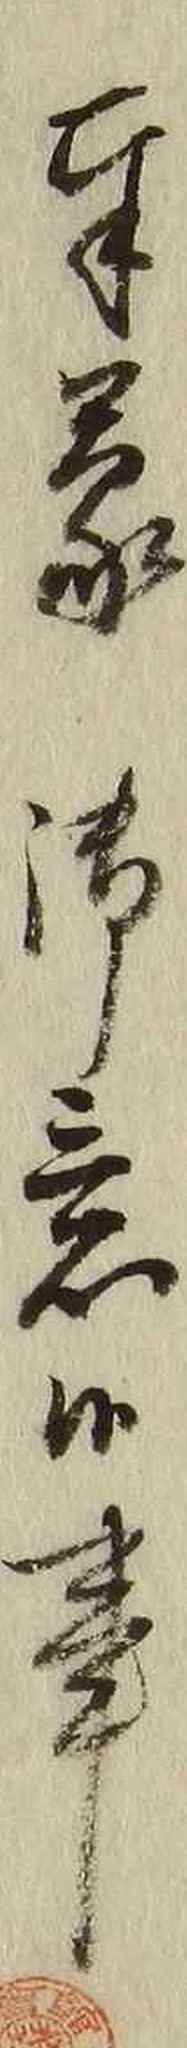奉蒙御意候事
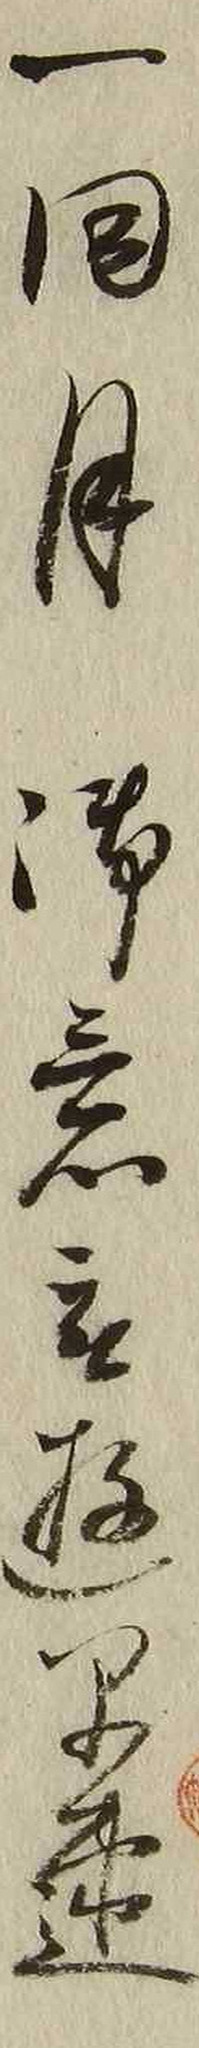一同月御意被遊早速
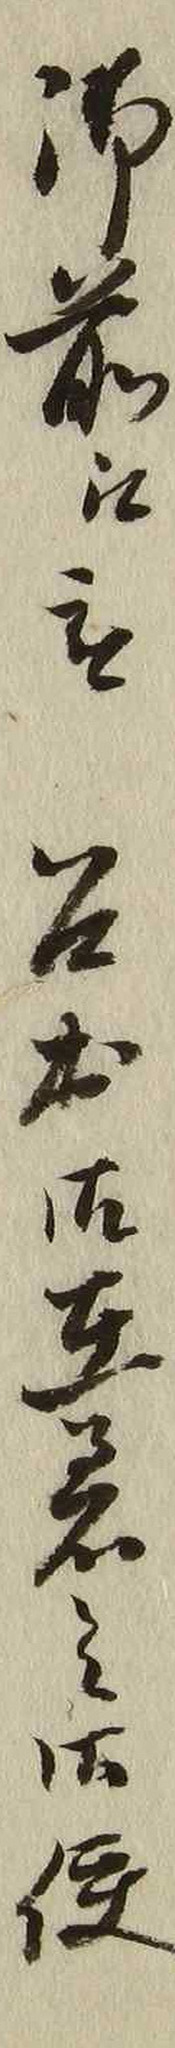御前江被召出御在着之御使
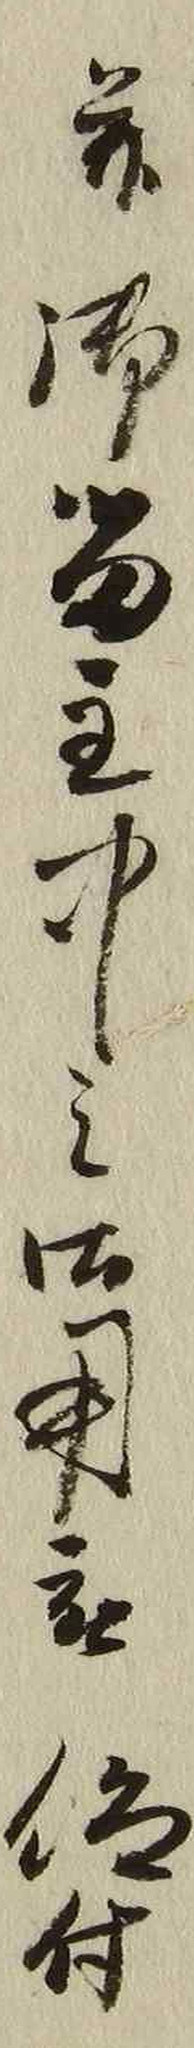并御留主中之御用被仰付
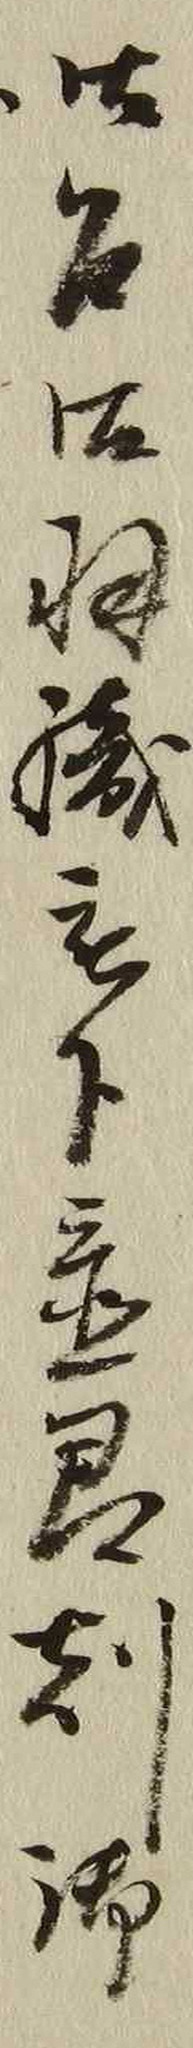御召御羽織被下置即刻御
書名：諸士系譜　巻之355　す之部5
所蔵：会津若松市立会津図書館
